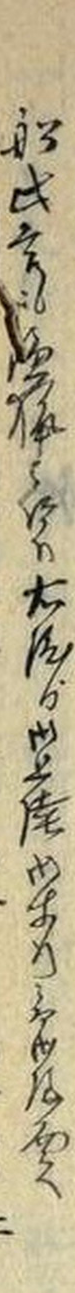船此節も漁猟被仰付右渡ゟ御上陸御歩行ニ而御帰殿

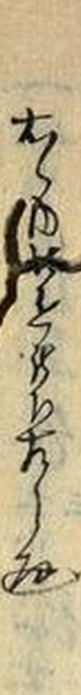右之内被進被下左之通
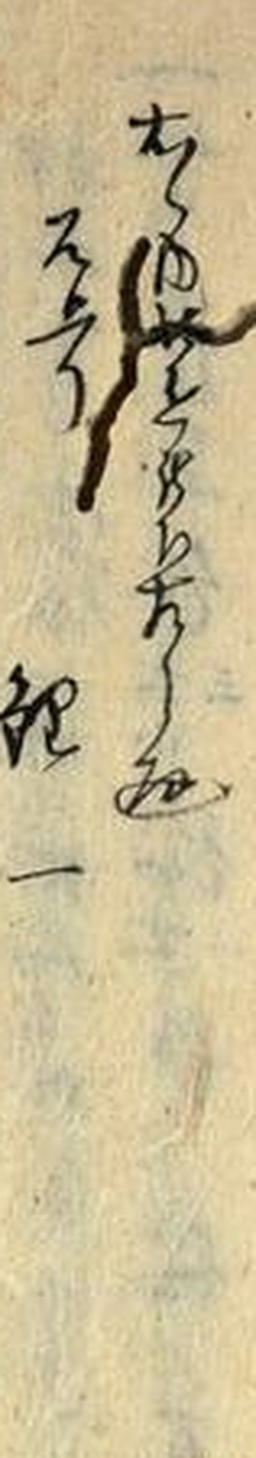召上り鯉一
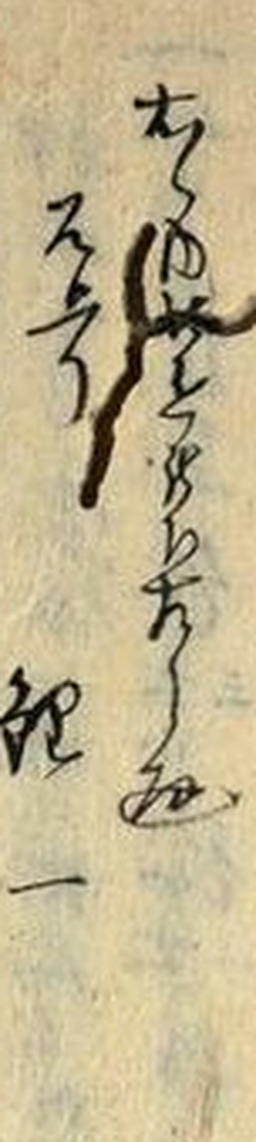召上り鯉一
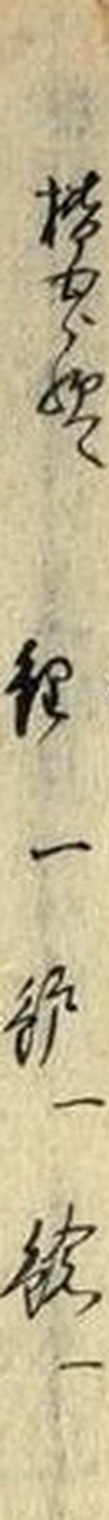揩五郎様へ鯉一魲一鯰一
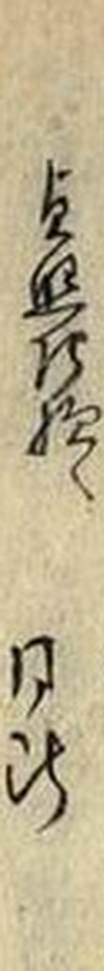貞院様へ同断
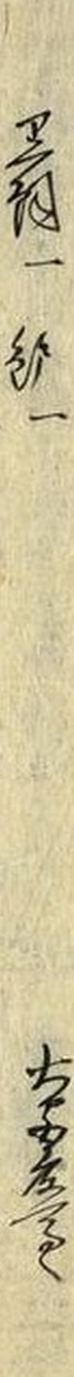黒鯛一魲一大宮藤馬へ
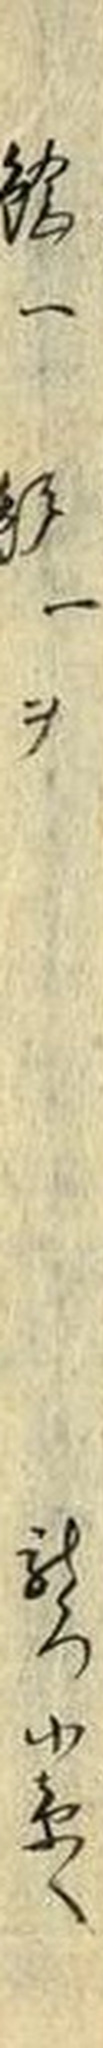鯰一魲一ヲ新右衛門小兵衛へ
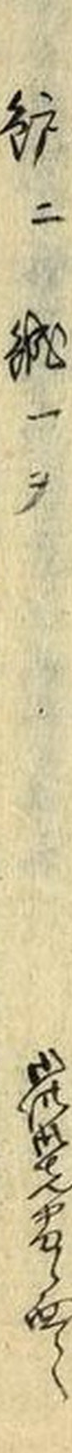魲二鯎一ヲ御供御先番之面々へ
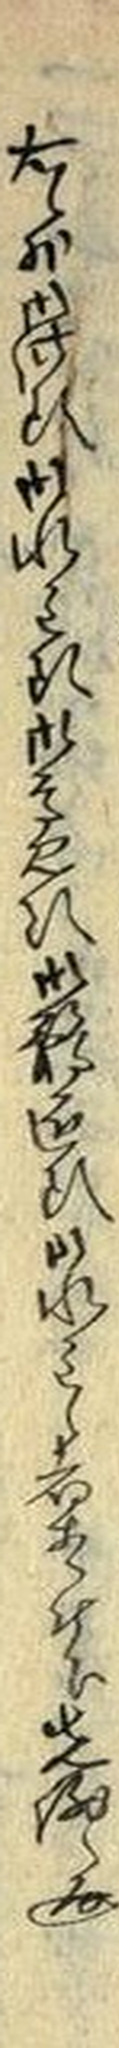右之外御供頭御水主頭御鳥見頭御鵜匠頭御水主之者等へ被下先例之通
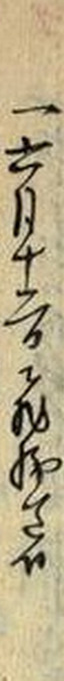一六月十二日飛脚着
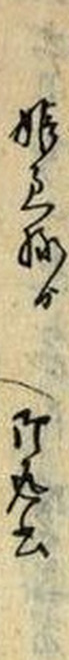姫君様ゟ御返書
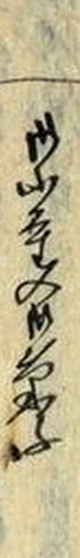御小重入御菓子
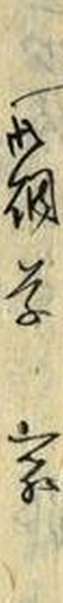御烟草一箱
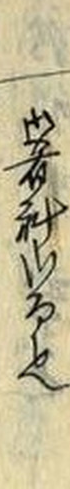御肴料弐壱疋
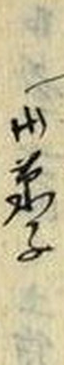御菓子
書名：少傅日録抄（斉承付側向頭取日記、在国）
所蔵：福井県文書館 Fukui Prefectural Archives
